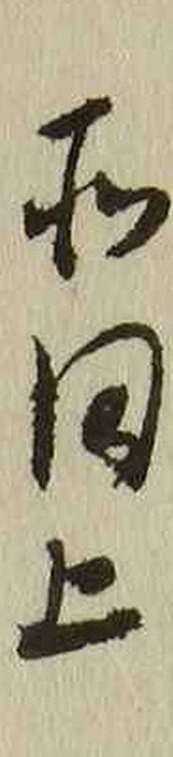所同上
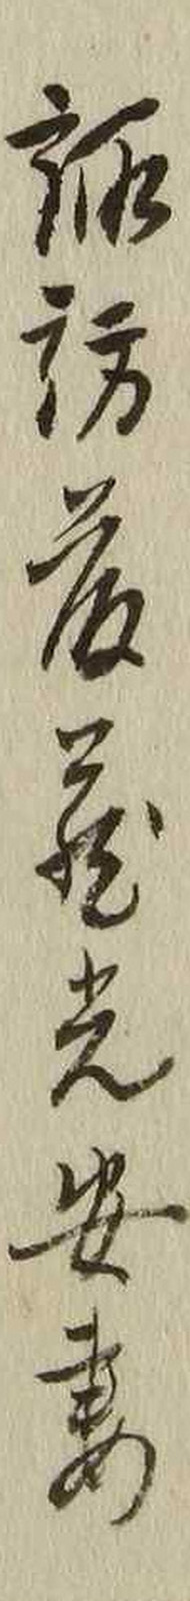女諏訪藤蔵光安妻
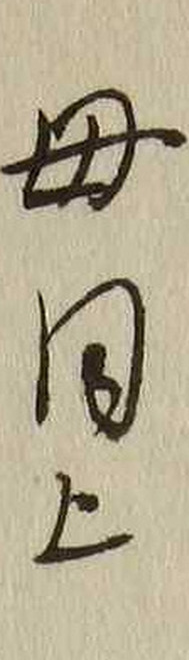母同上
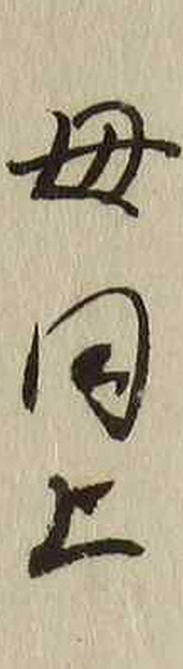母同上
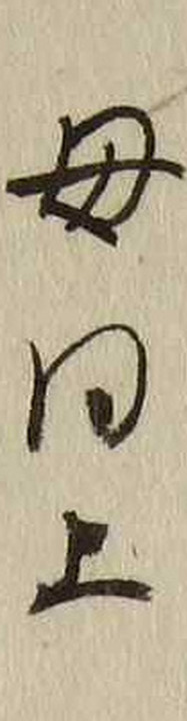母同上
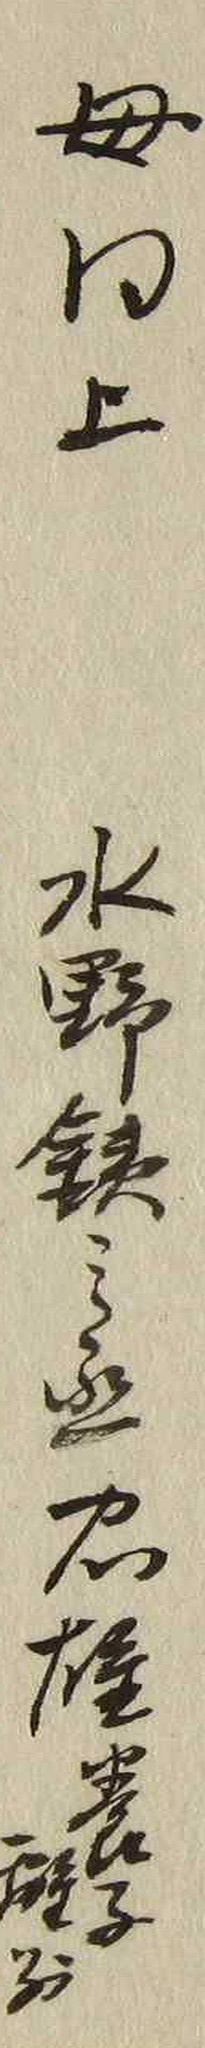母同上水野鉄之丞忠雄養子離別
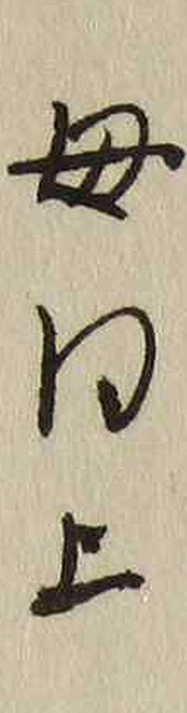母同上
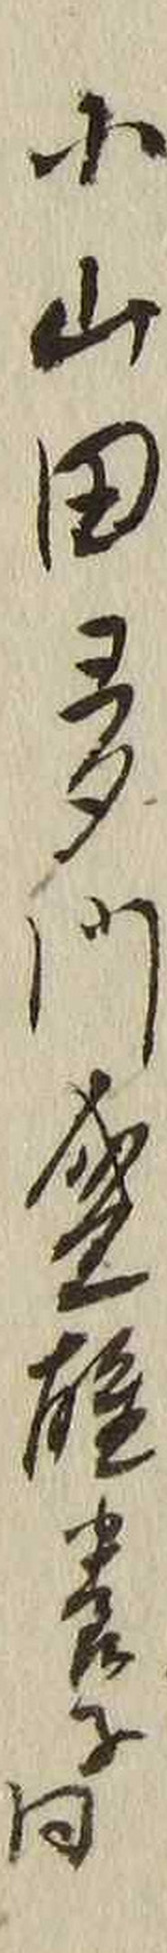小山田多門盛雄養子同
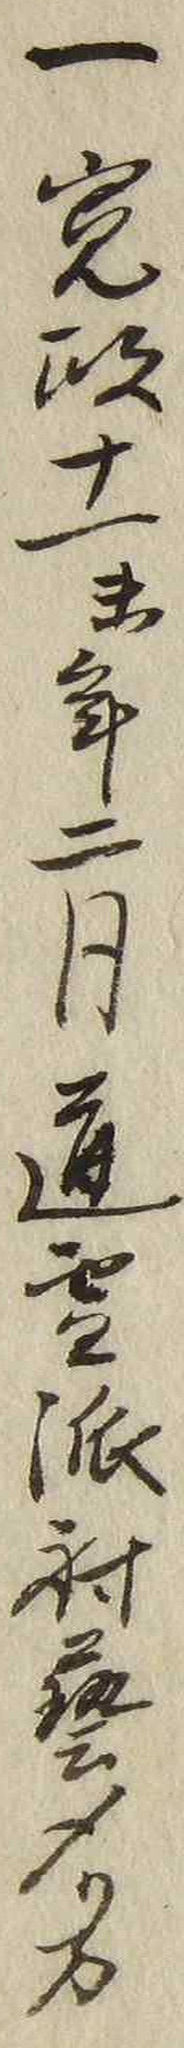一寛政十一未年二月道雪派射芸〆リ方
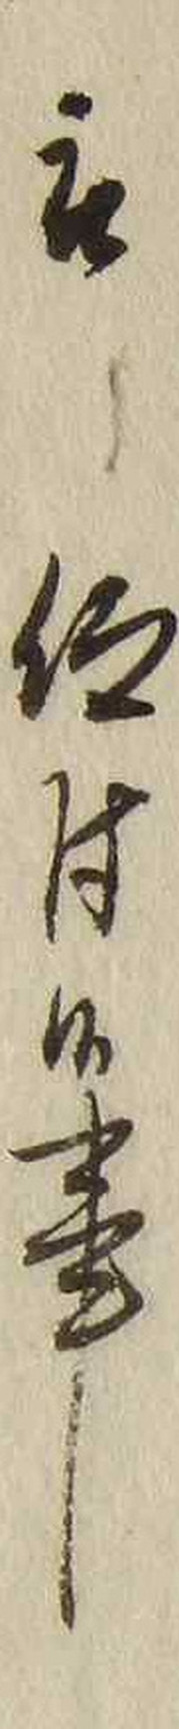被位付候事

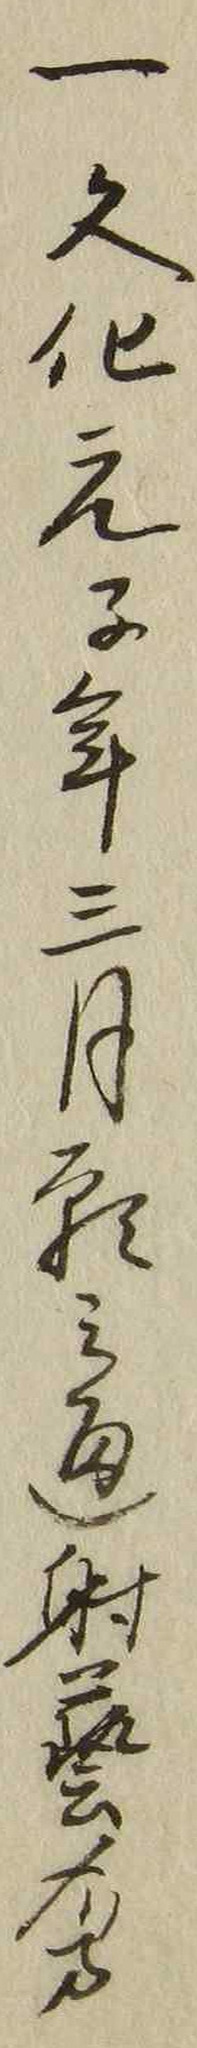一文化元子年三月願之通射芸〆り方
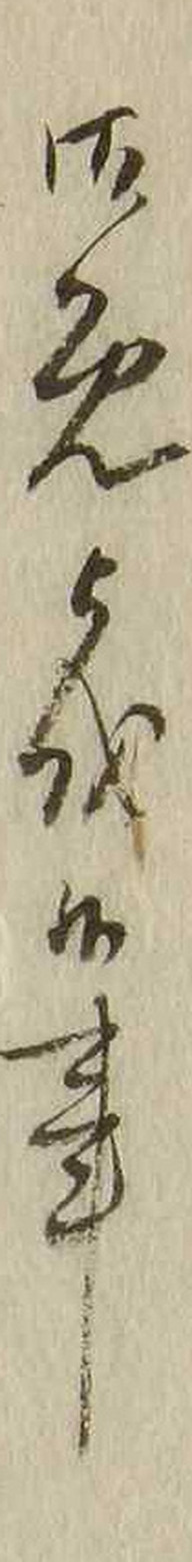御免被成候事
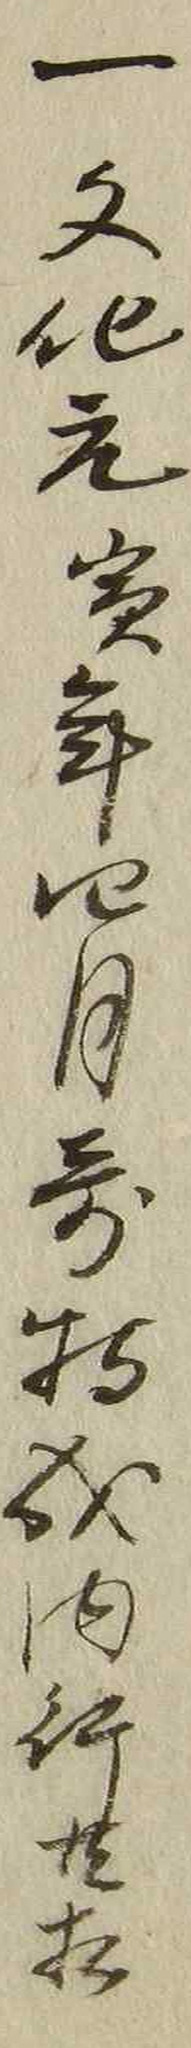一文化元寅年四月奇特成内行共相
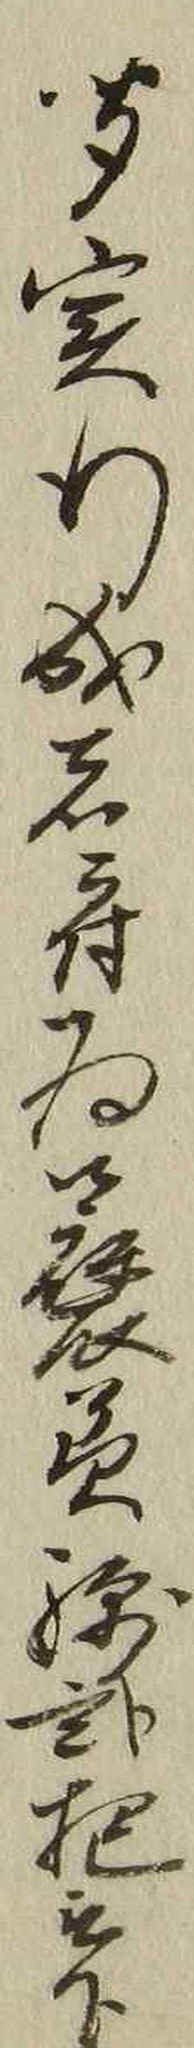聞実行成者ニ付為御褒美綿弐把被下
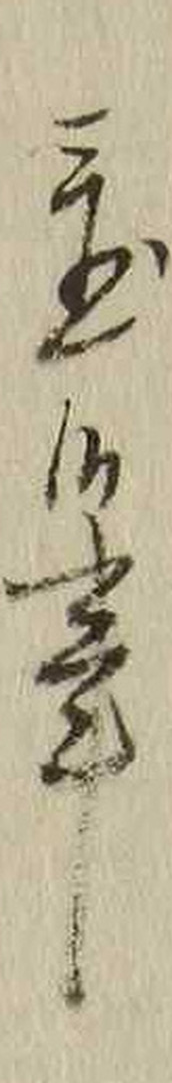置候事
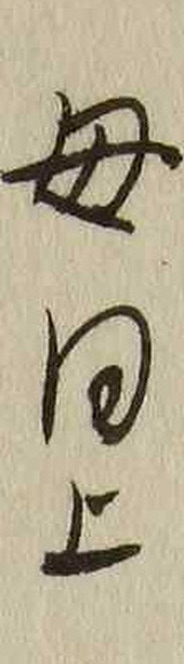母同上
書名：諸士系譜　巻之359　す之部9
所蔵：会津若松市立会津図書館
